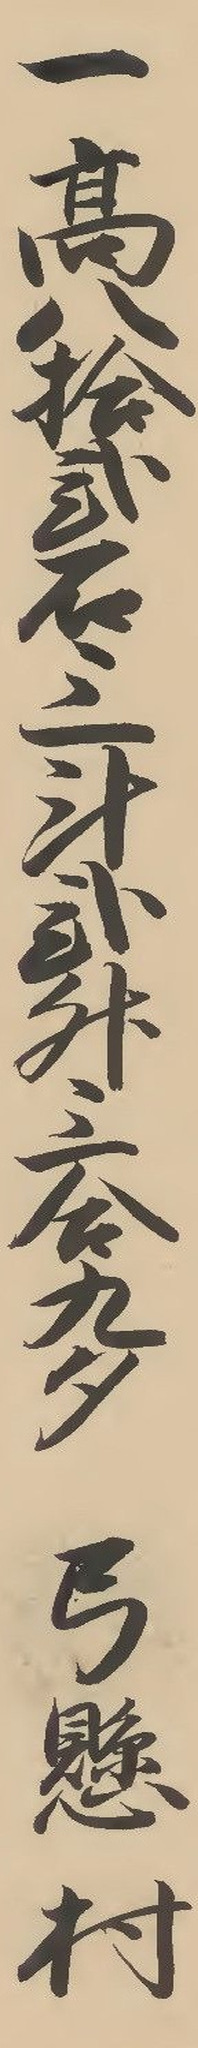一高八拾弐石三斗弐升三合九勺弓懸村
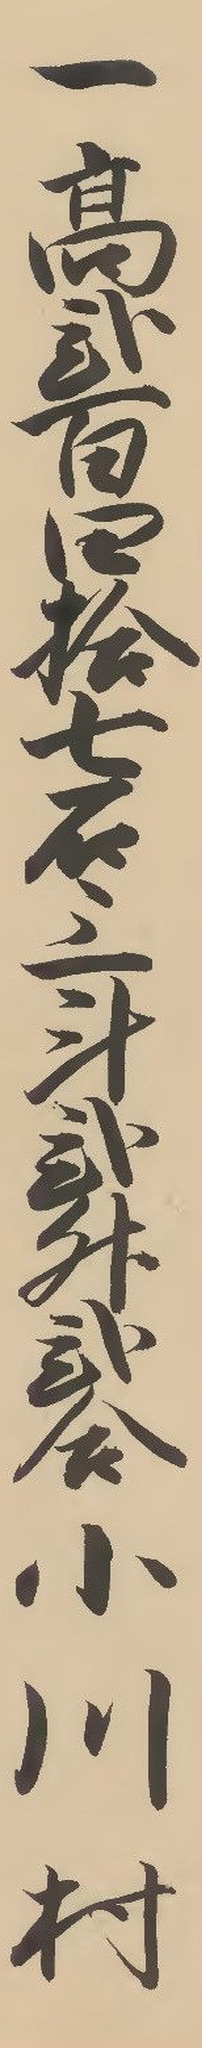一高弐百四拾七石三斗弐升弐合小川村
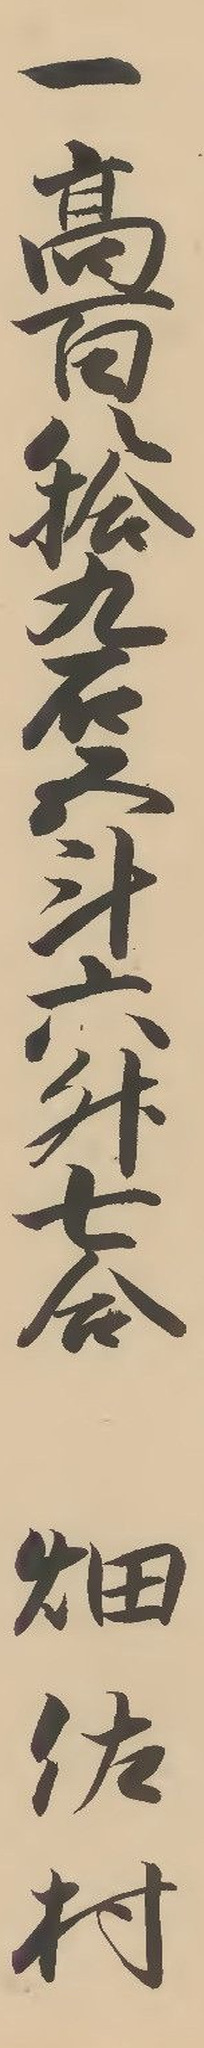一高百八拾九石五斗六升七合畑佐村

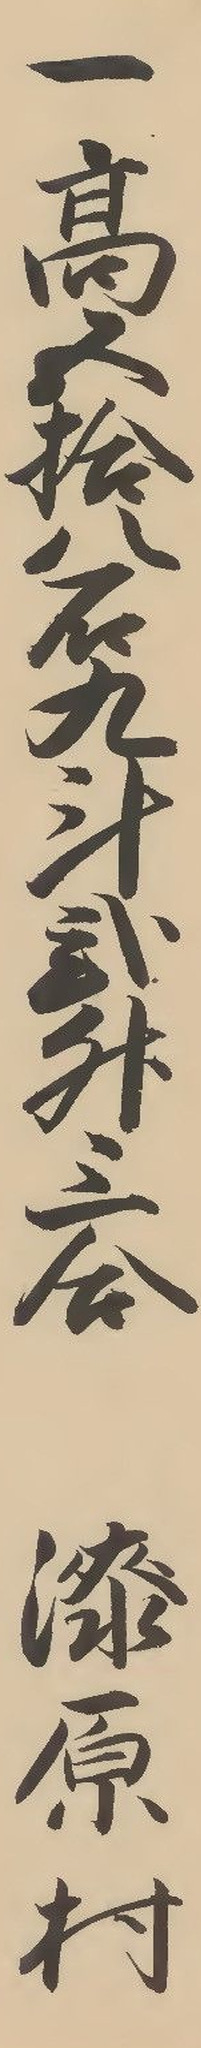一高五拾八石九斗弐升三合漆原村
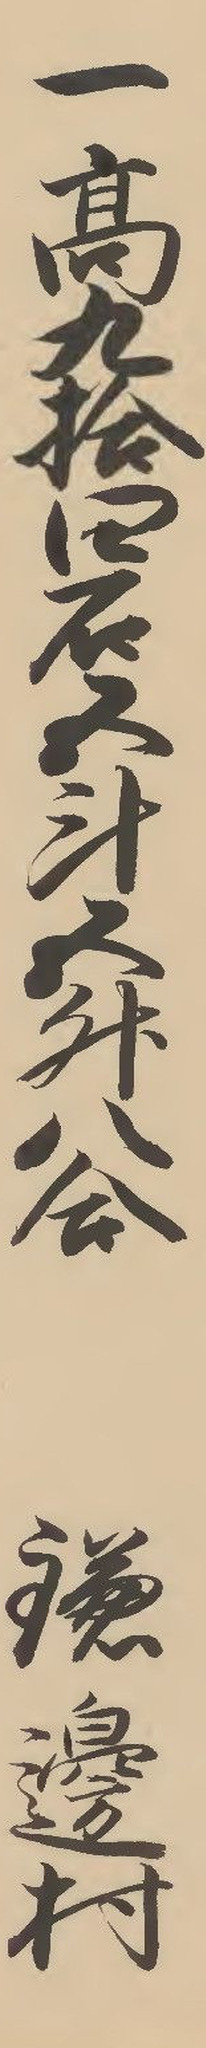一高九拾四石五斗五升八合鎌辺村
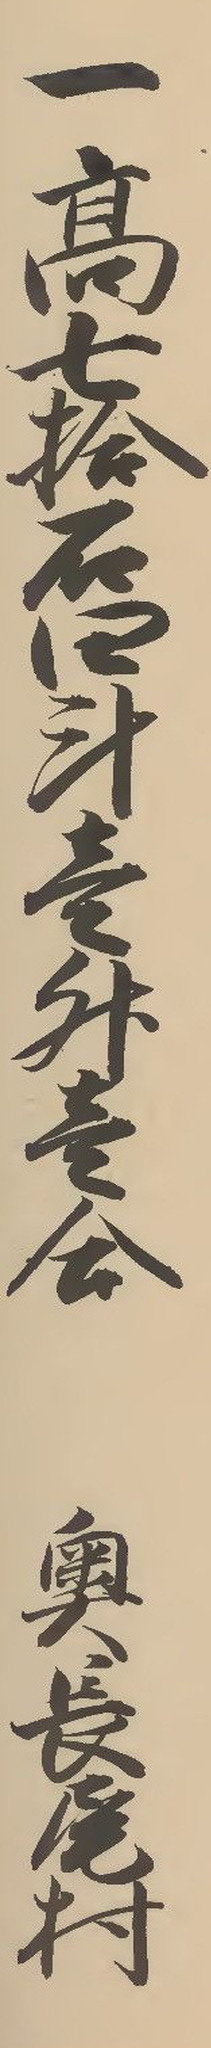一高七拾石四斗壱升壱合奥長尾村
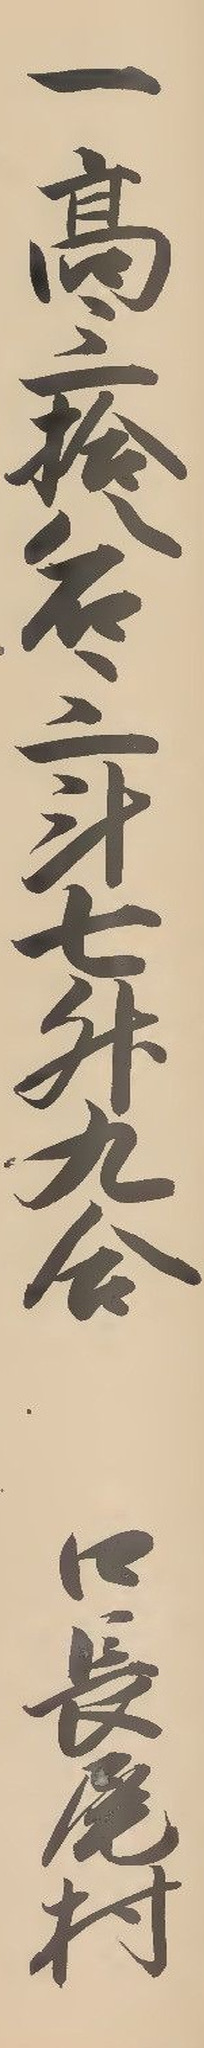一高三拾八石三斗七升九合口長尾村
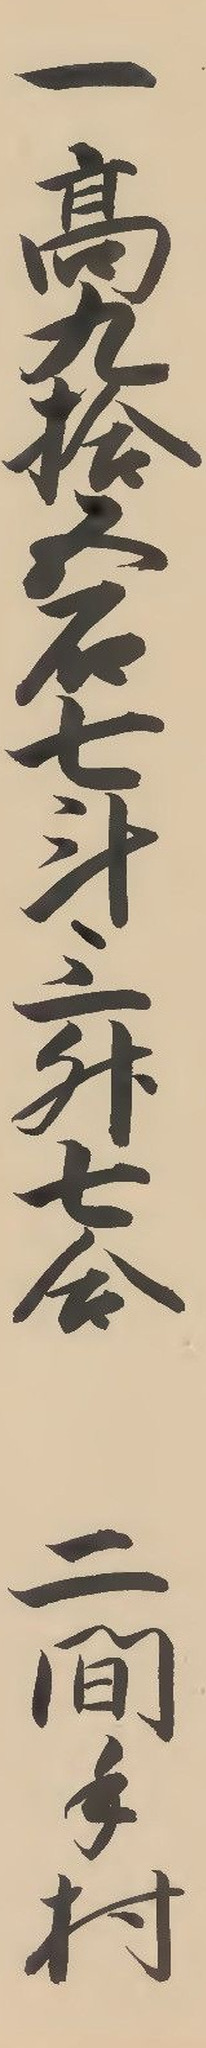一高九拾五石七斗三升七合二間手村
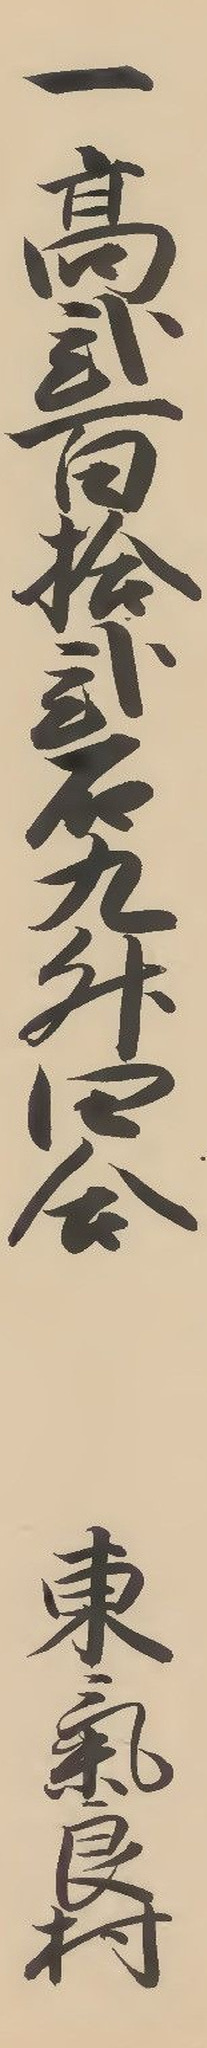一高弐百拾弐石九升四合東気良村
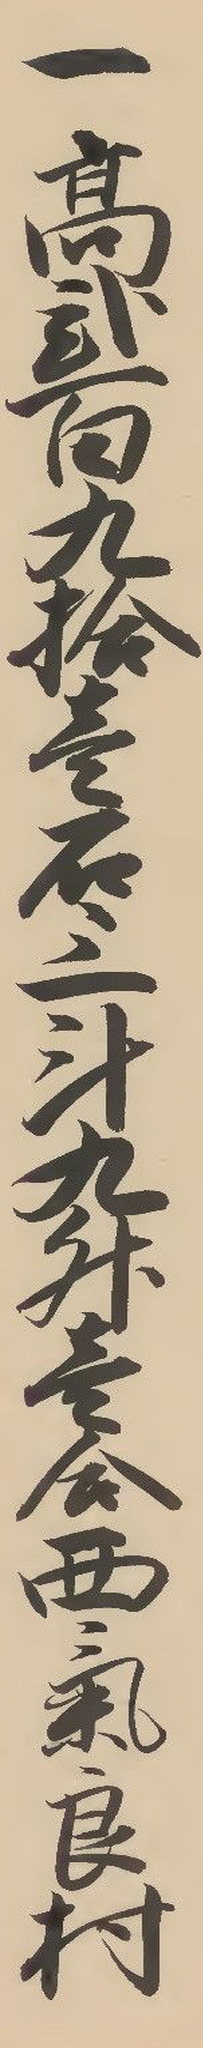一高弐百九拾壱石三斗九升壱合西気良村

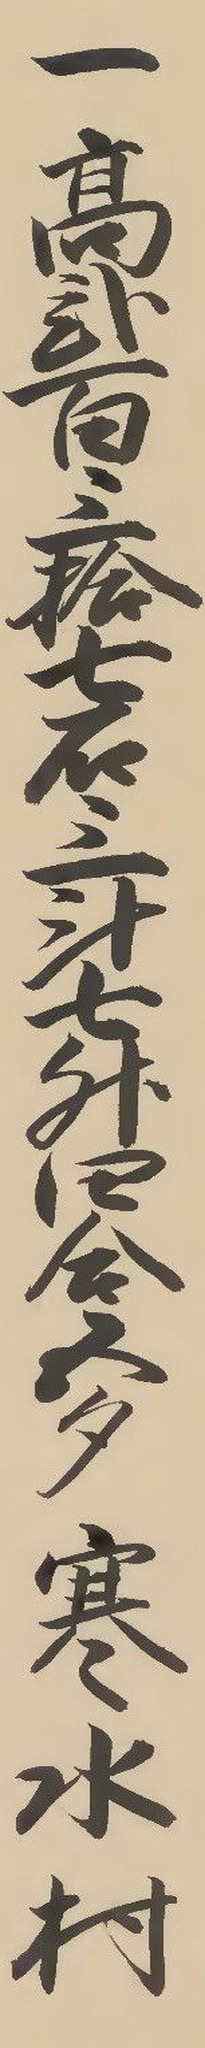一高弐百三拾七石三斗七升四合五勺寒水村
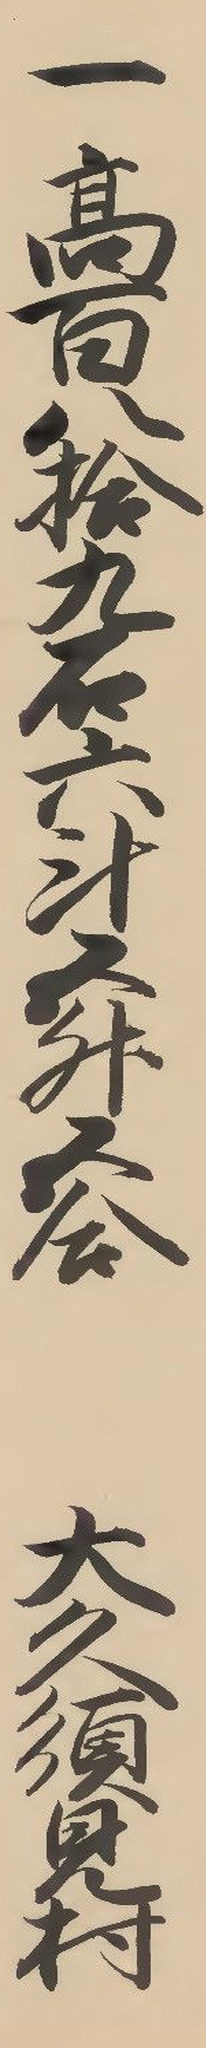一高百八拾九石六斗五升五合大久須見村
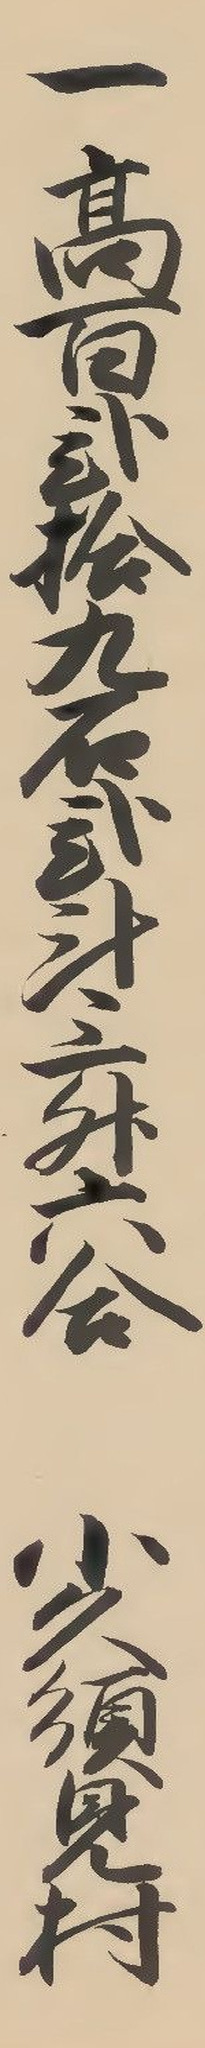一高百弐拾九石弐斗三升六合小久須見村
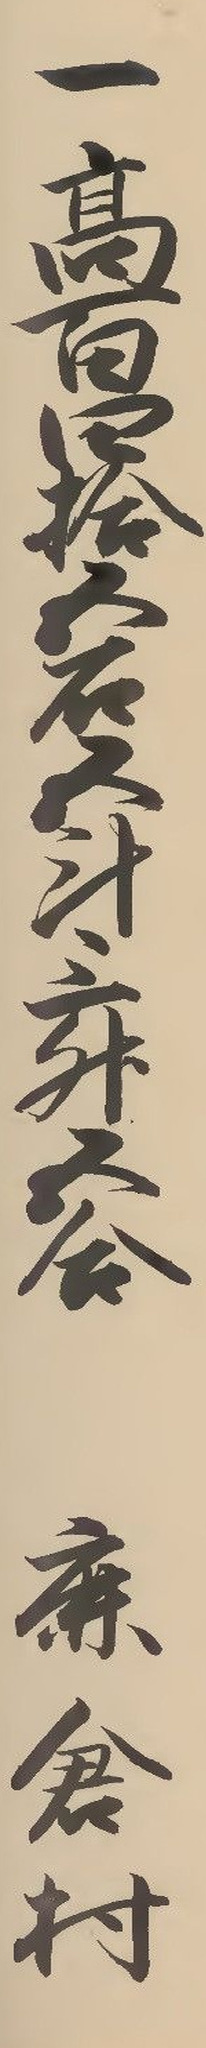一高百四拾五石五斗三升五合鹿倉村
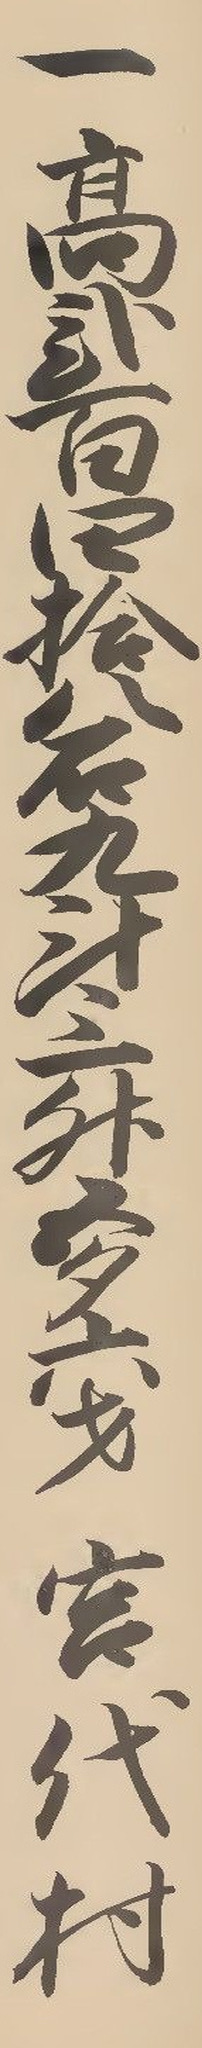一高弐百四拾八石九斗三升五勺六才宮代村
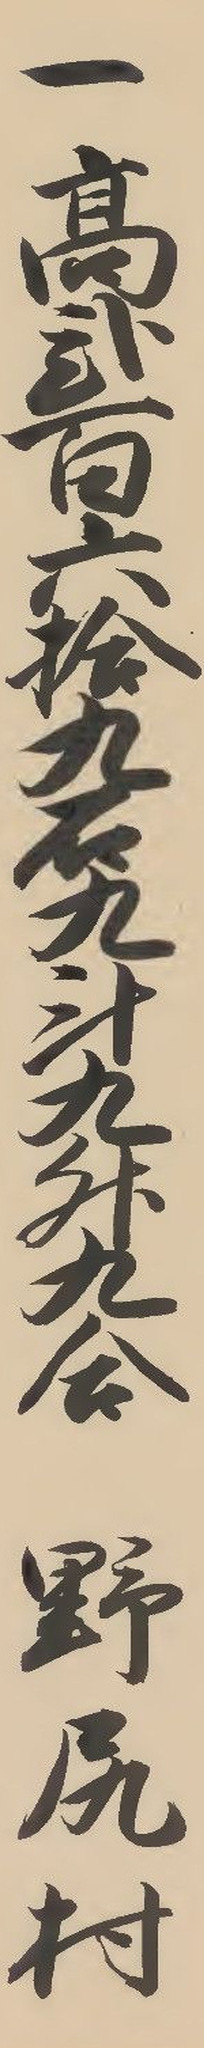一高弐百六拾九石九斗九升九合野尻村
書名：美濃国郷帳
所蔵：国立公文書館 National Archives of Japan
